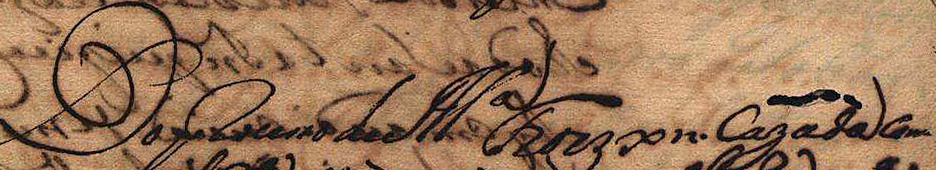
Do processo de M.a Froez xn. cazada com
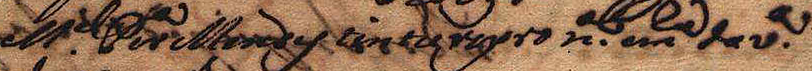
M.el Pera Mendes tintureyro nal e mra da v.a
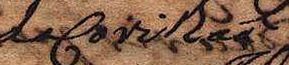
da Covilhaã
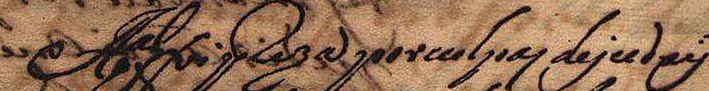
A q.al foi pReza por culpas de judais
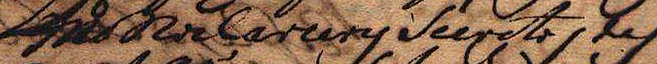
mo nos carceres secretos des
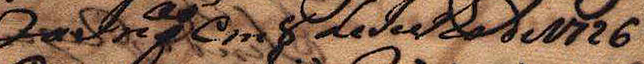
ta Inqaõ em 8 de Iulho de 1726
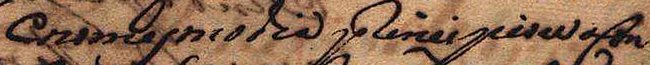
e no mesmo dia principiou a Con
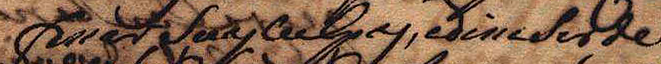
fessar suas culpas, e disse ser de
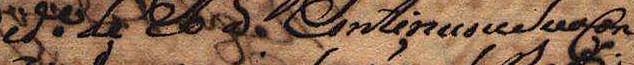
id.e de 26 ā. Continuou sua Con
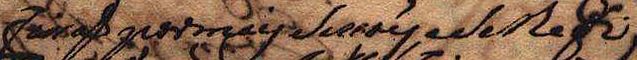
fissaõ por mais sessoẽs, e se lhe fi
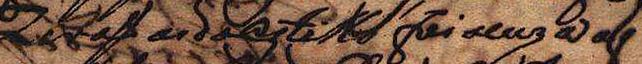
Zeram as do estillo foi acuza a q̄
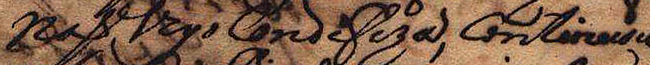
naõ veyo con defeza, continuou
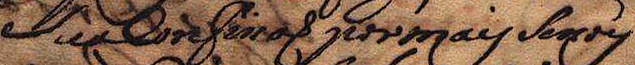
sua confissaõ por mais sessoẽs
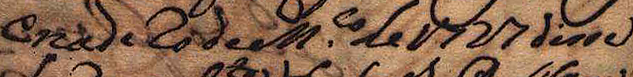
e na de 20 de M.co de 1727 disse
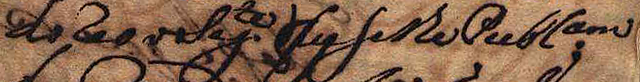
do Reo o seg.te Fez se lhe Publ.am
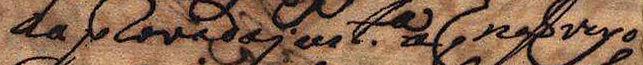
da prova da just.a a q naõ veyo
